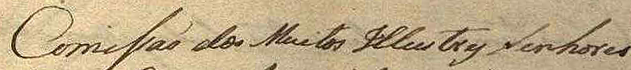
Comissaõ dos Muitos Illustres Senhores
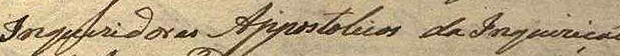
Inquizidores Appostolicos da Inquiziçaõ
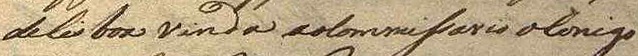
de lisboa vinda ao Commissario o Conigo
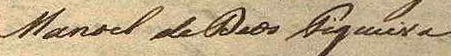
Manoel de Deos Figueira
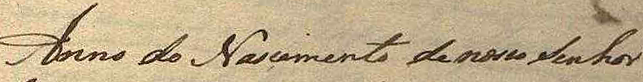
Anno do Nasçimento de nosso Senhor
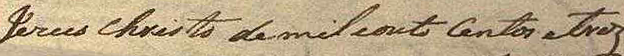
Iezus Christo de mil e outoCentos e trez
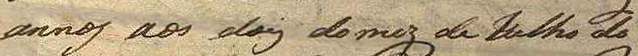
annos aos dois do mez de Iulho do
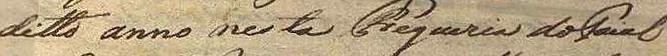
ditto anno nesta Freguezia do Faial
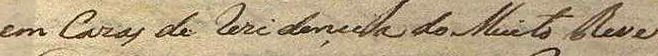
em Cazas de Rezidençia do Muito Reve
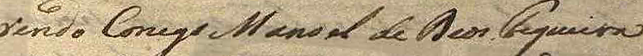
rendo Conego Manoel de Deos Figueira
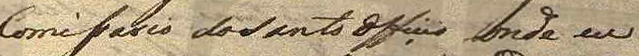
Comissario do santo Offiçio onde eu
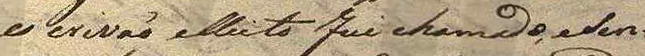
escrivaõ elleito fui chamado, e sen
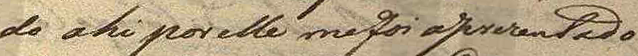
do ahi por elle me foi aprezentado
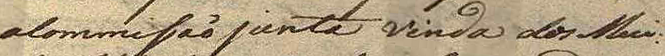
a commissaõ junta vinda dos Mui
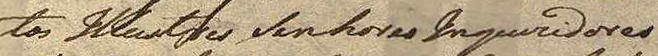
tos Illustres Senhores Inquizidores
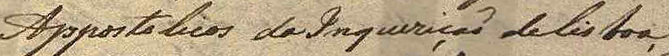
Appostolicos da Inquiziçaõ de lisboa,
